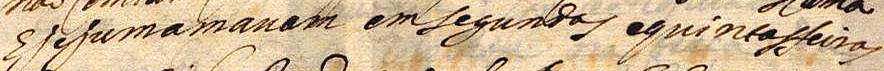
E jejumamauam em segundas e quintas feiras
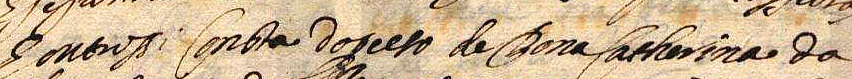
E outrossi Consta do ꝓceso de Dona Catherina da
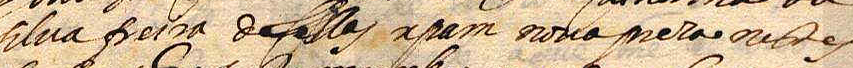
silua freira de Cellas xpam noua preza nestes
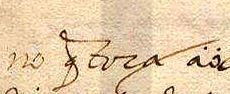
no q̄ toca ao
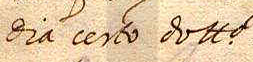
dia certo do tt.o
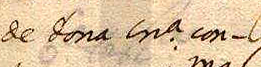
de dona Cn.a con
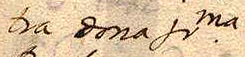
tra dona jr.ma
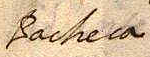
Pacheca
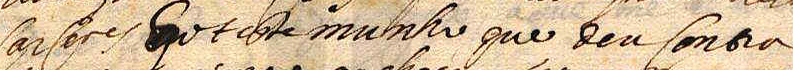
CarCeres E o testemunho que deu Contra
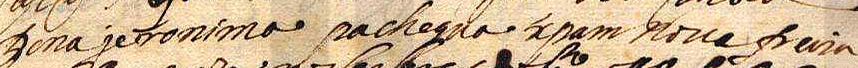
Dona jeronima pachequa xpam noua freira
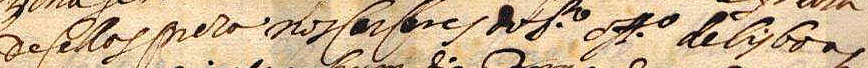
de Cellas preza nos CarCeres do S.to off.o de lisboa,
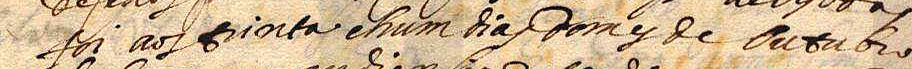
foi aos trinta e hum dias do mes de Outubro
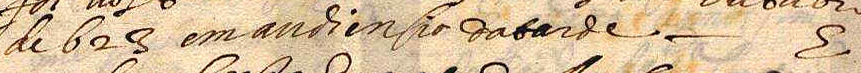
de 623 em audienCia da tarde – E
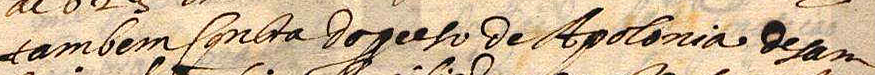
tambem Consta do ꝓceso de Apolonia de sam
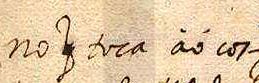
no q̄ toca ao cos
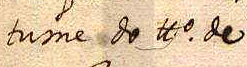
tume do tto. de
